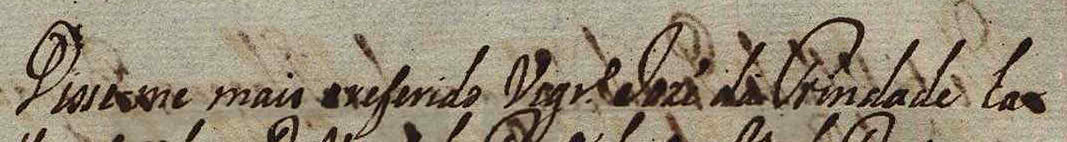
Disse-me mais o referido Vigr.o Iozé da Trindade, ha
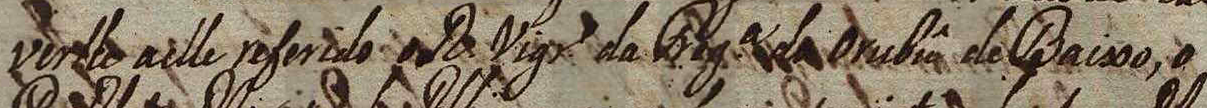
verlhe a elle referido o R. Vigr.o da Freg.a de Orubû de Baixo, o
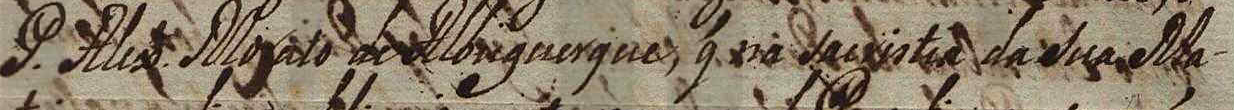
P Alex.e Mo_ato de Albuquerque, q̄ na sacristia da Sua Ma
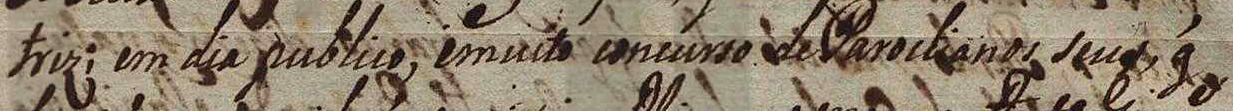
triz; em dia publico, e muito concurso de Parochianos seus, q̄
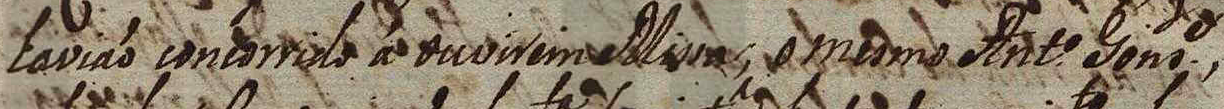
haviaõ concorrido á ouvirem Missa; o mesmo Ant.o Gons.e,
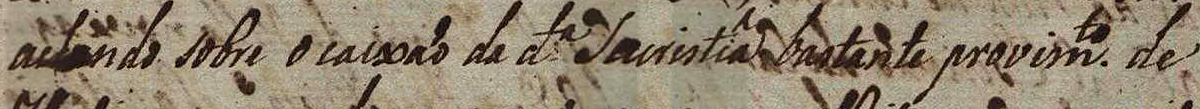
achando sobre o caixaõ da d̄a Sacristia bastante provim.to de
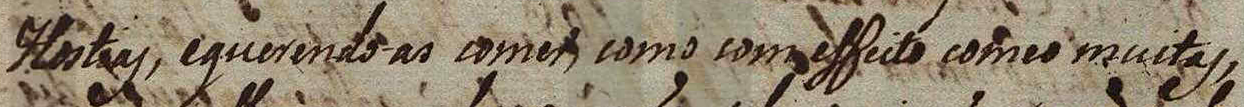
Hostias, e querendo-as comer, como com effeito comeo muitas,
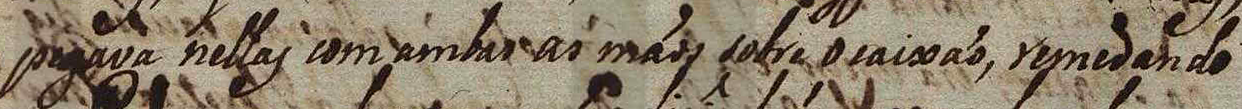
pegava nellas com ambas as maõs sobre o caixaõ, remedando
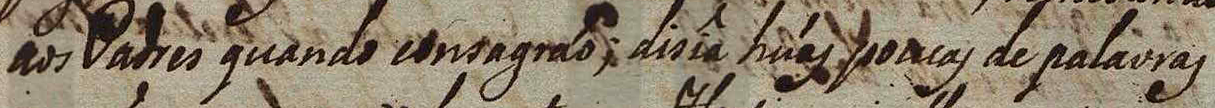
aos Padres quando consagraõ; disia huās poucas de palavras
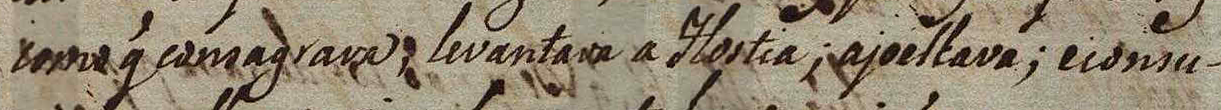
como q̄ consagrava, levantava a Hostia; ajoellava; e consu
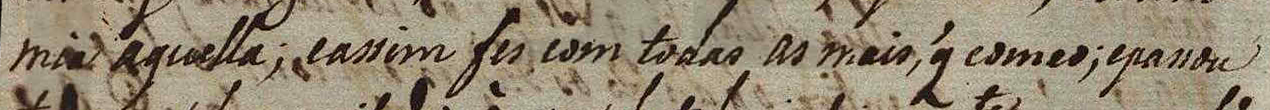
mia aquella; e assim fes com todas as mais, q̄ comeo; e passou
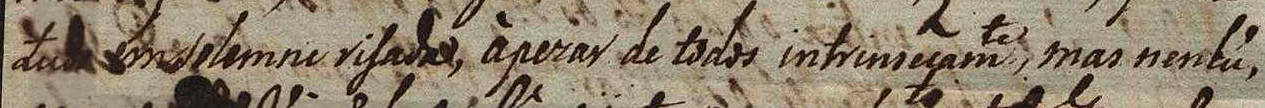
tu_ em solemne risada, àpezar de todos intrinsecam.te, mas nenhū,
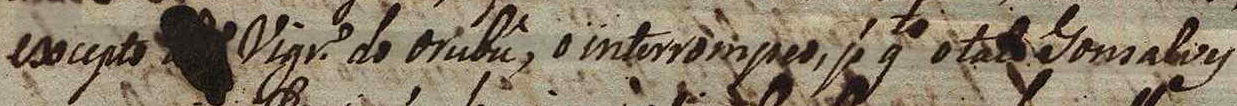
excepto _ Vigr. do Orubû, o interrompeo, p̄qto o tal Gonsalves
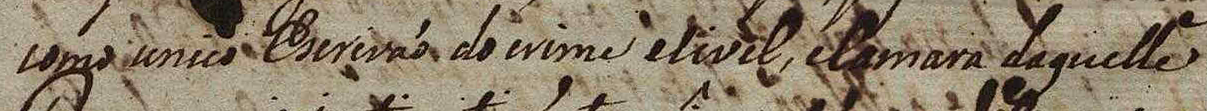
como unico Escrivaõ do crime, e Civel, e Camara daquelle
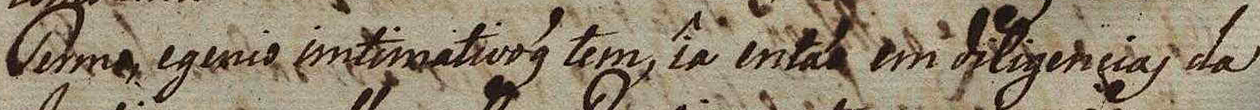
Termo, e genio imtimativo q̄ tem, ia entaõ em diligencias da
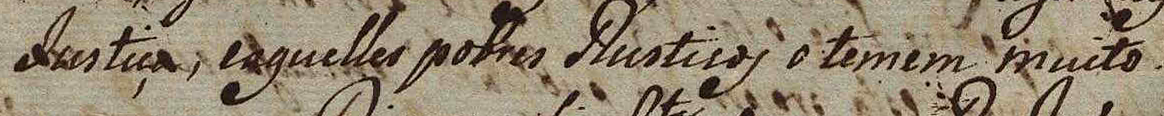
Justiça, e aquelles pobres Rusticos o temem muito.
